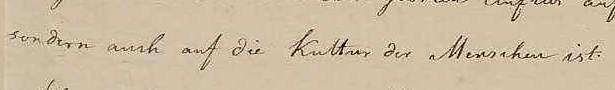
sondern auch auf die Kultur der Menschen ist.
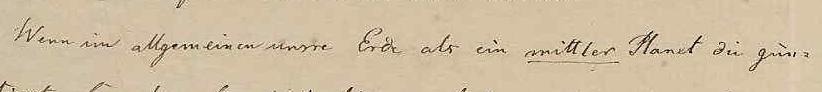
Wenn im allgemeinen unsre Erde als ein mittler Planet die gün-
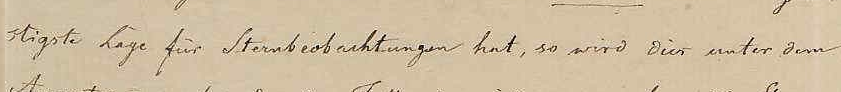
stigste Lage für Sternbeobachtungen hat, so wird dies unter dem
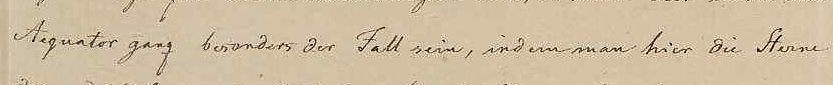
Aequator ganz besonders der Fall sein, indem man hier die Sterne
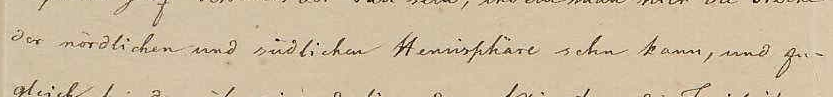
der nördlichen und südlichen Hemisphäre sehn kann, und zu-
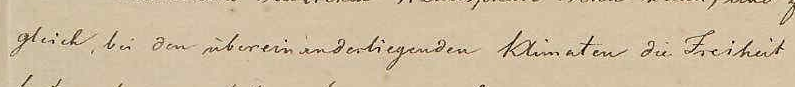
gleich, bei den übereinanderliegenden Klimaten die Freiheit
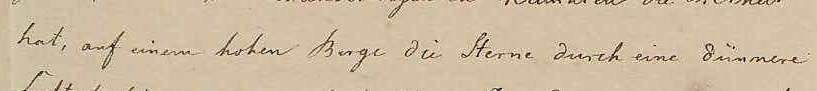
hat, auf einem hohen Berge die Sterne durch eine dünnere
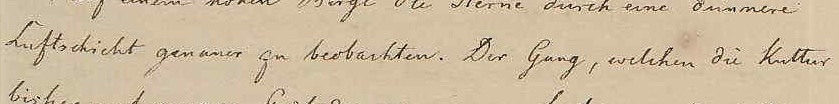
Luftschicht genauer zu beobachten. Der Gang, welchen die Kultur
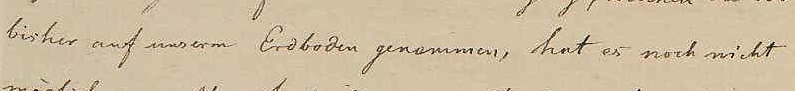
bisher auf unserm Erdboden genommen, hat es noch nicht
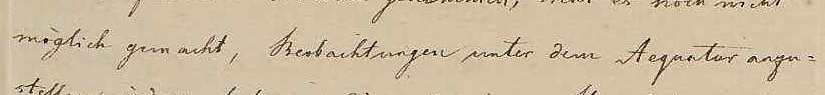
möglich gemacht, Beobachtungen unter dem Aequator anzu-
